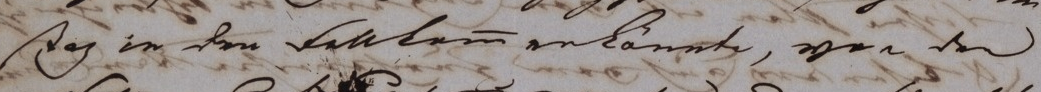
stag in den Fall kommen könnte, von den
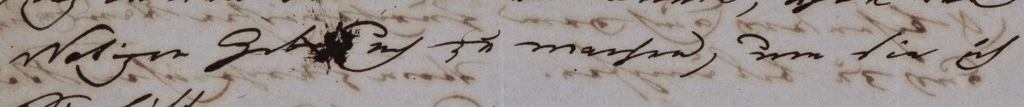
Notizen Gebrauch zu machen, um die ich
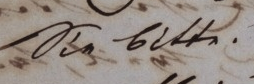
Sie bitte.
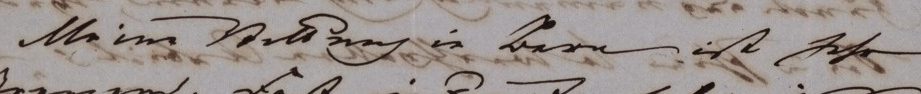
Meine Stellung in Bern ist sehr
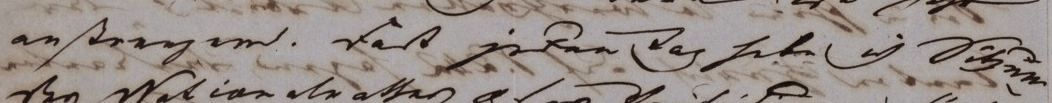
anstrengend. Fast jeden Tag habe ich Sitzung
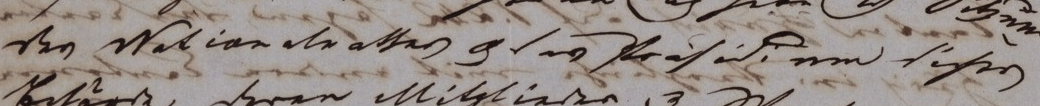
des Nationalrathes & das Präsidium dieser
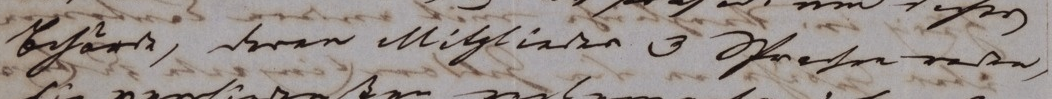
Behörde, deren Mitglieder 3 Sprachen reden,
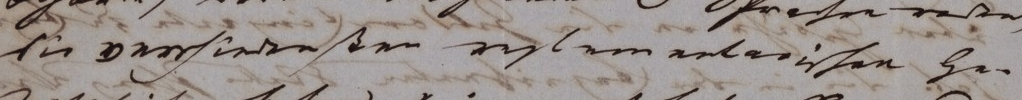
die verschiedensten reglementarischen Ge-
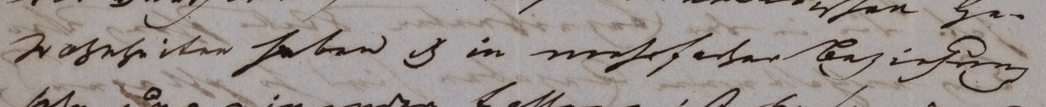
wohnheiten haben & in mehrfacher Beziehung
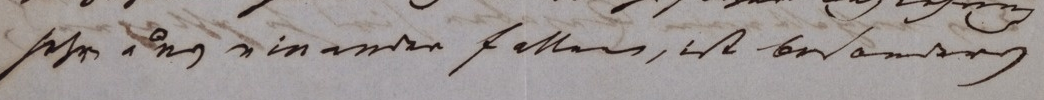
sehr aus einander fallen, ist besonders
